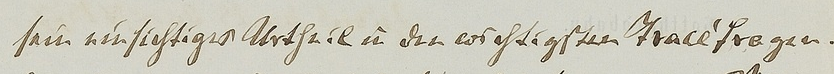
sein einsichtiges Urtheil in den wichtigsten Tracéfragen.
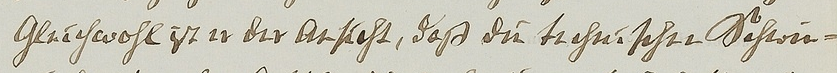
Gleichwohl ist er der Ansicht, daß die technischen Schwie-
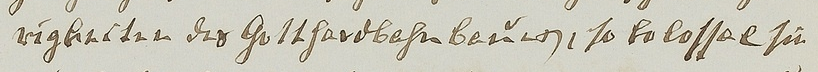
rigkeiten des Gotthardbahnbaues, so kolossal sie
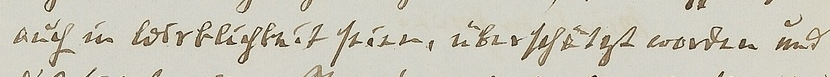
auch in Wirklichkeit seien, überschätzt worden und
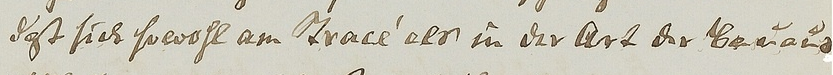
daß sich sowohl am Tracé als in der Art der Bauaus-
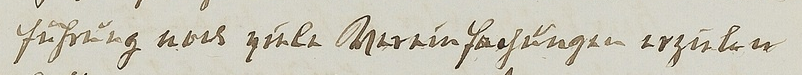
führung noch viele Vereinfachungen erzielen
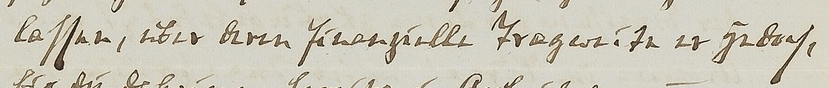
lassen, über deren finanzielle Tragweite er jedoch,
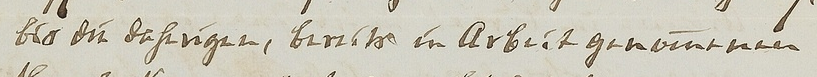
bis die daherigen, bereits in Arbeit genommenen
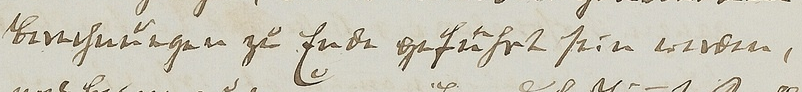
Berechnungen zu Ende geführt sein werden,
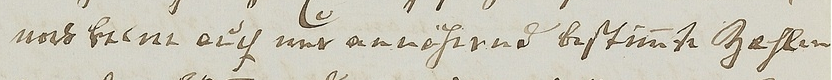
noch keine auch nur annähernd bestimmte Zahlen
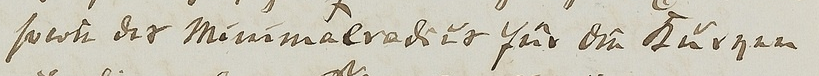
sowie des Minimalradius für die Kurven
